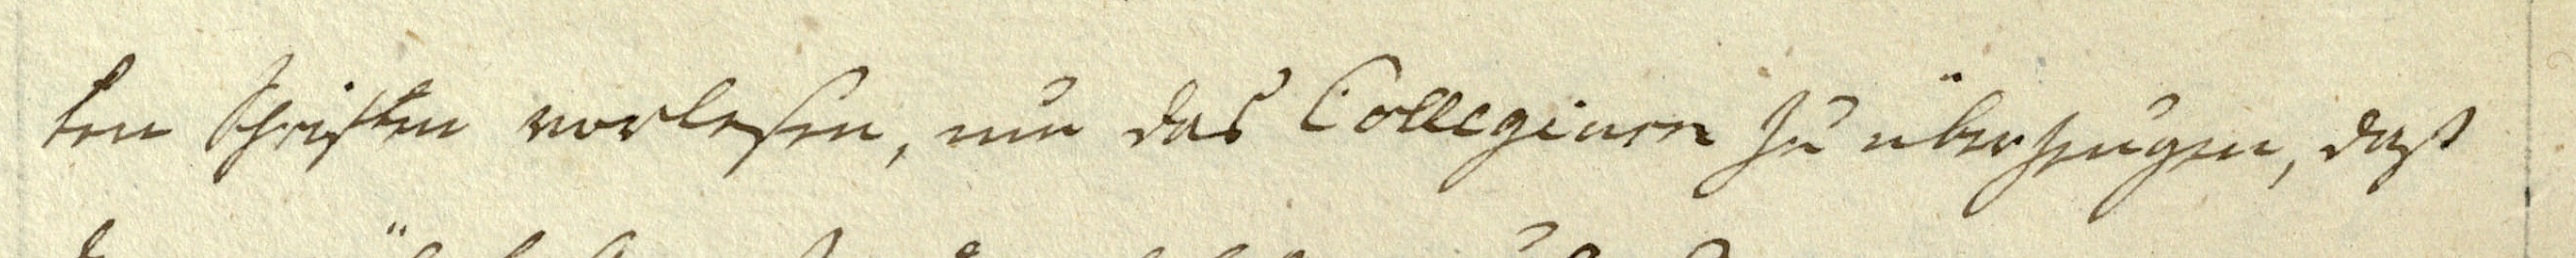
ten Schriften vorlesen, um das Collegium zu überzeugen, daß
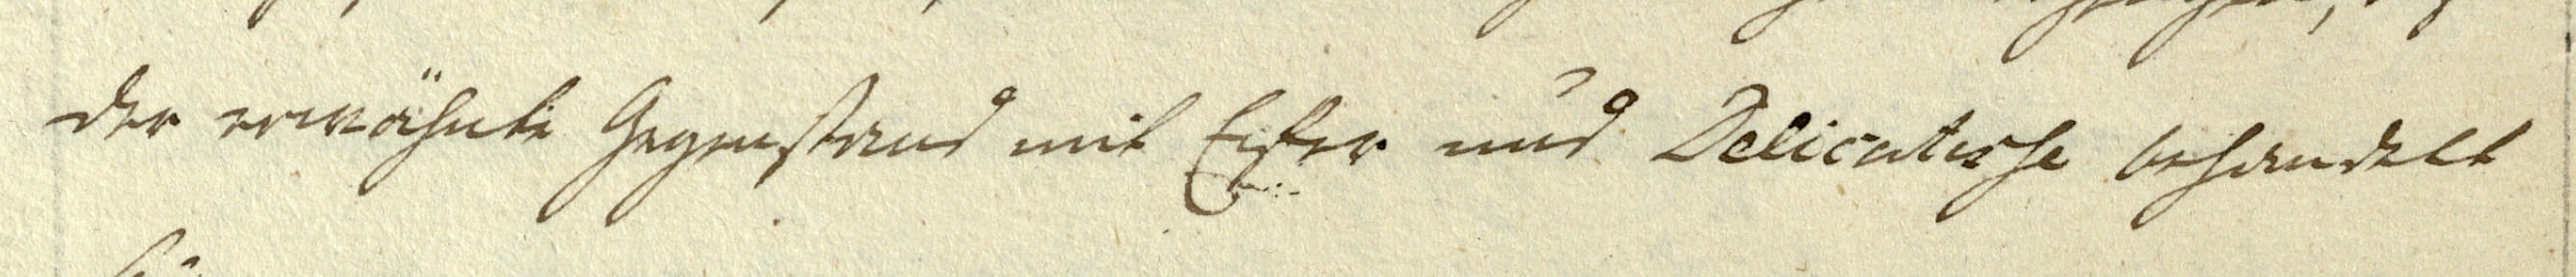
der erwähnte Gegenstand mit Eifer und Delicatesse behandelt
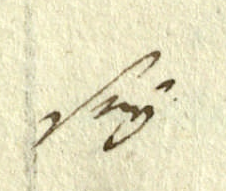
seÿ.
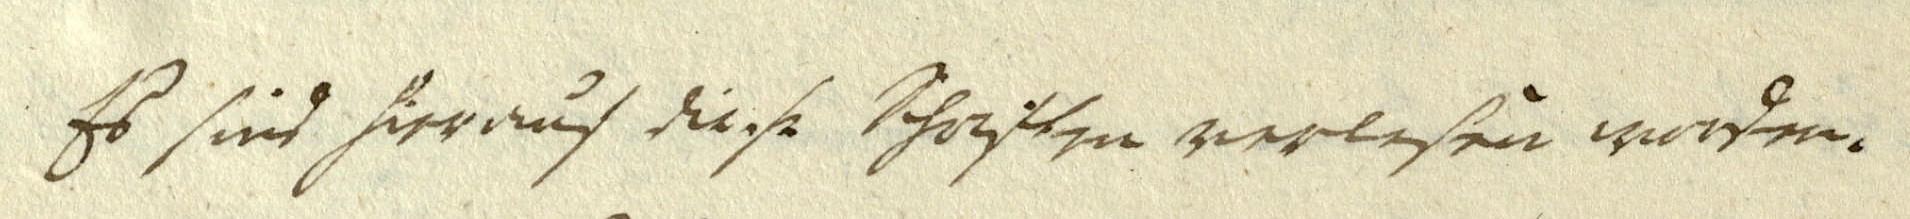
Es sind hierauf diese Schriften verlesen worden.
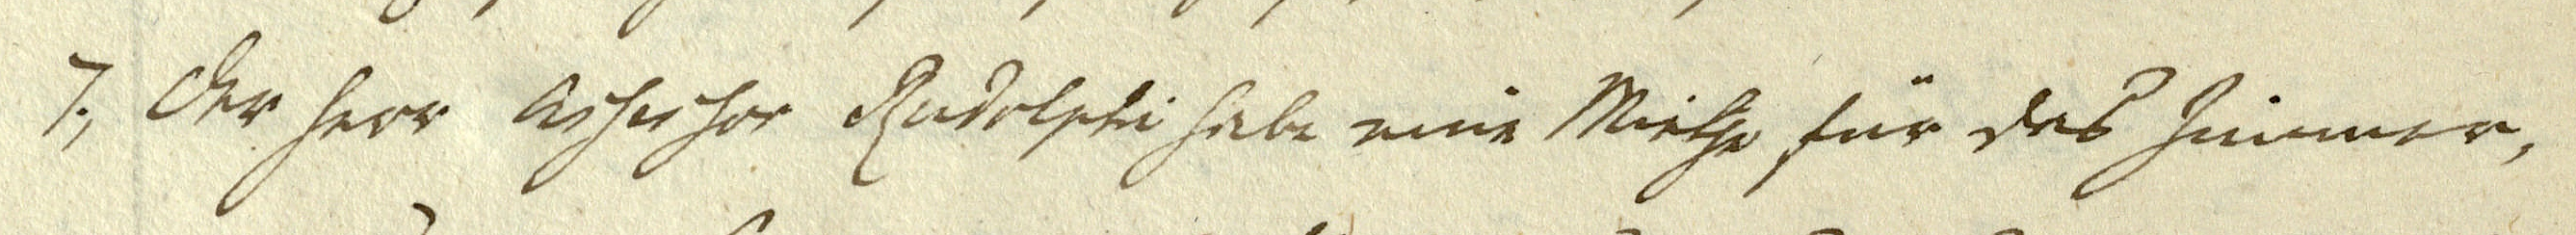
7., Der Herr Assessor Rudolphi habe eine Miethe für das Zimmer,
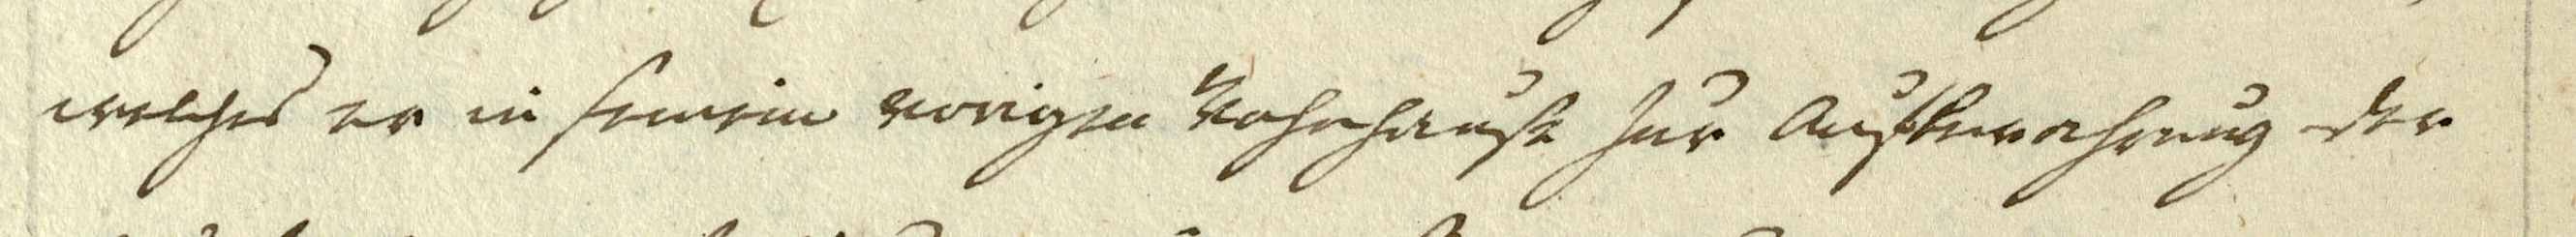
welches er in seinem vorigen Wohnhause zur Aufbewahrung der
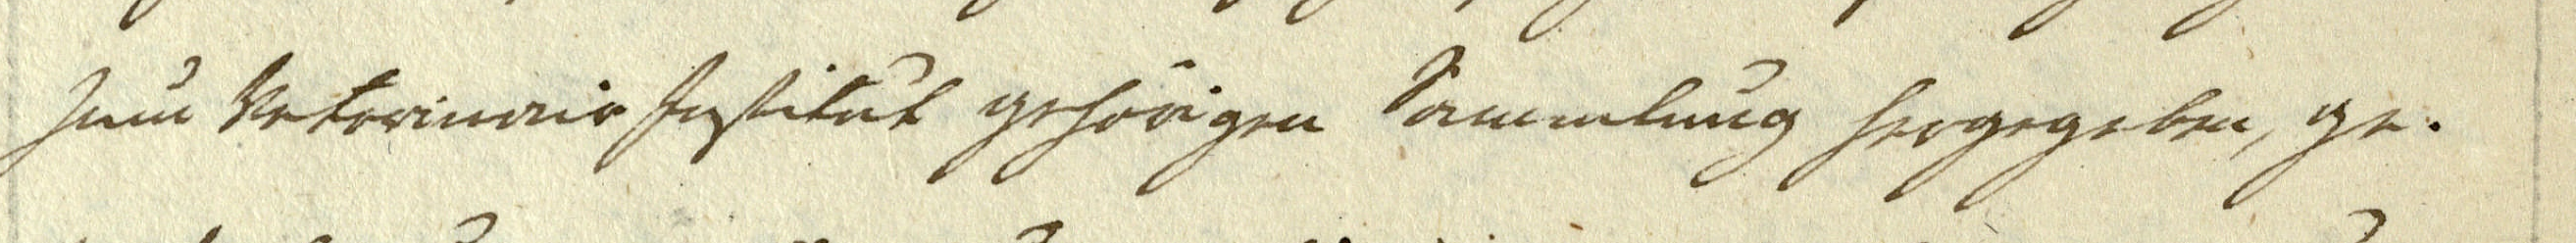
zum Veterinair Institut gehörigen Sammlung hergegeben, ge¬
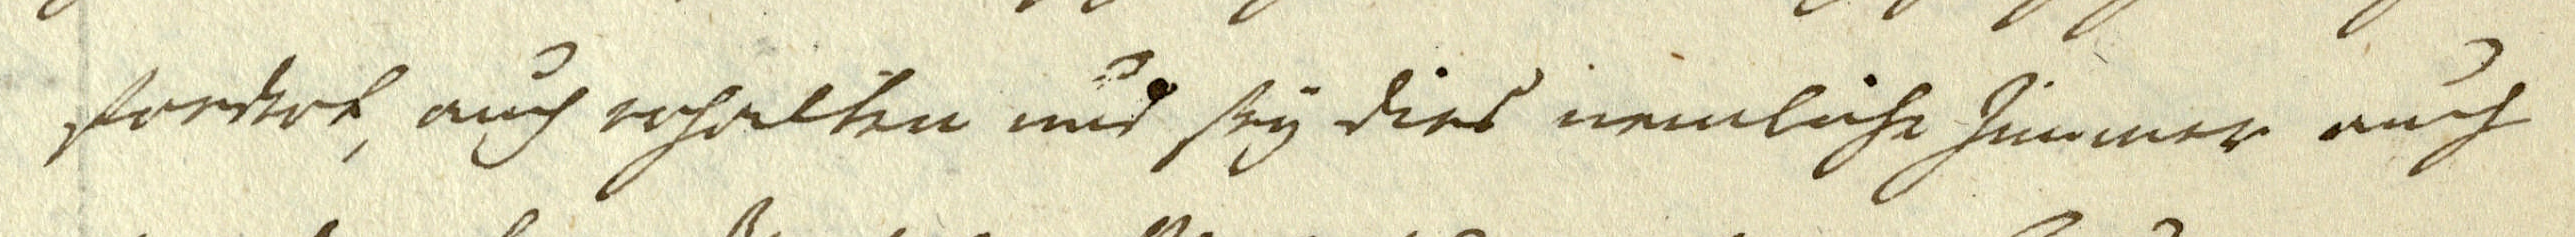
fordert, auch erhalten und seÿ dies nemliche Zimmer auch
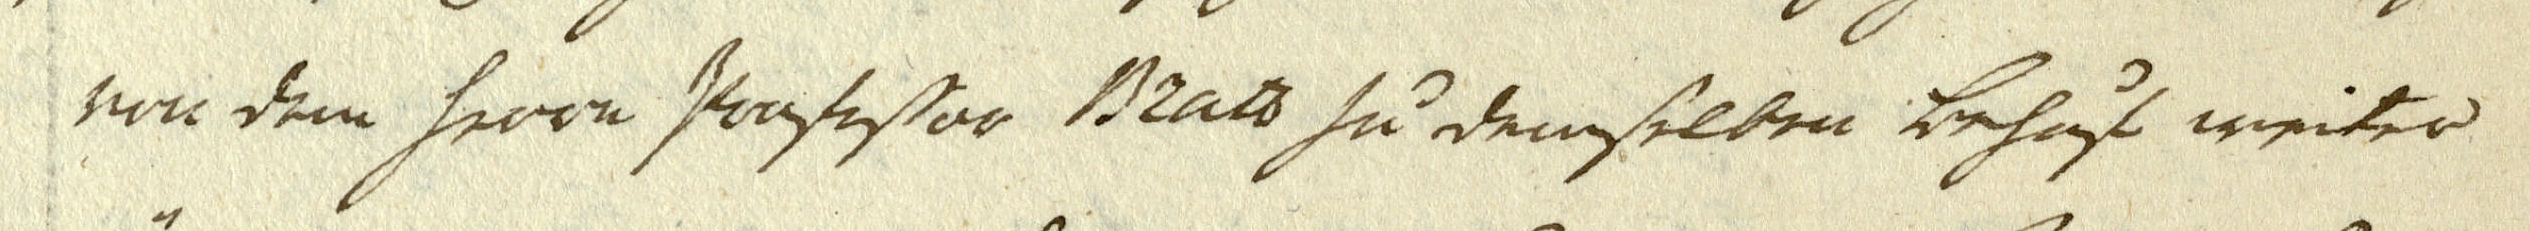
von dem Herrn Professor Bratt zu demselben Behuf weiter
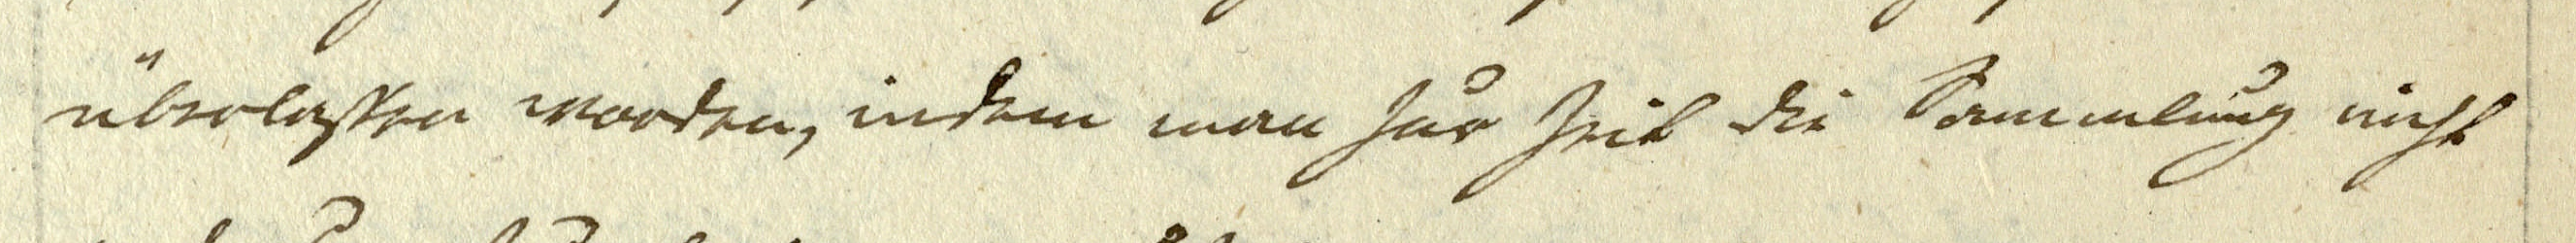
überlassen worden, indem man zur Zeit die Sammlung nicht
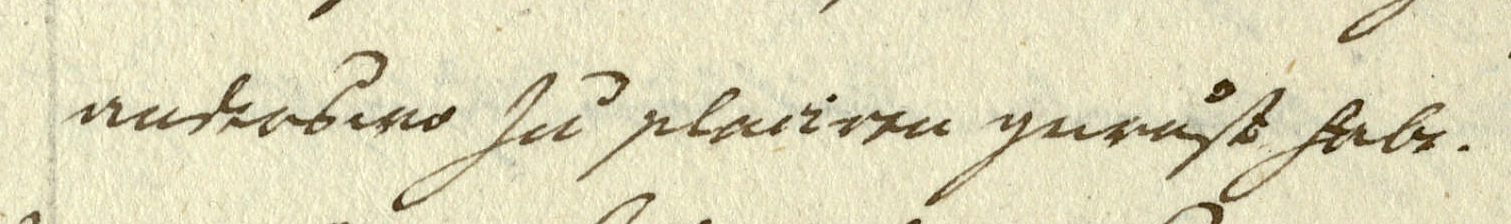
anderswo zu placiren gewußt habe.
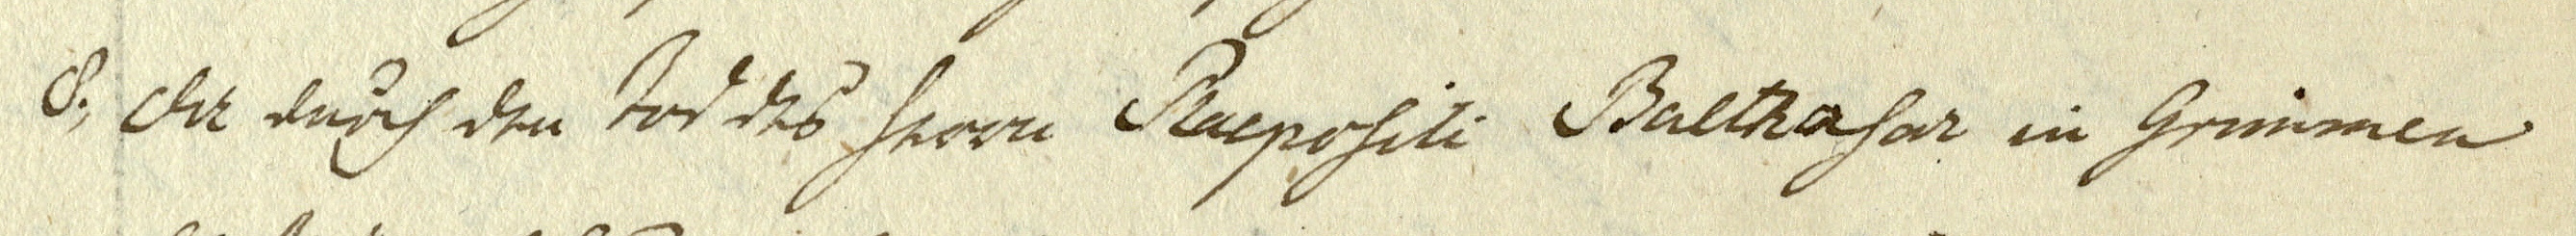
8. Da durch den Tod des Herrn Praepositi Balthasar in Grimmen
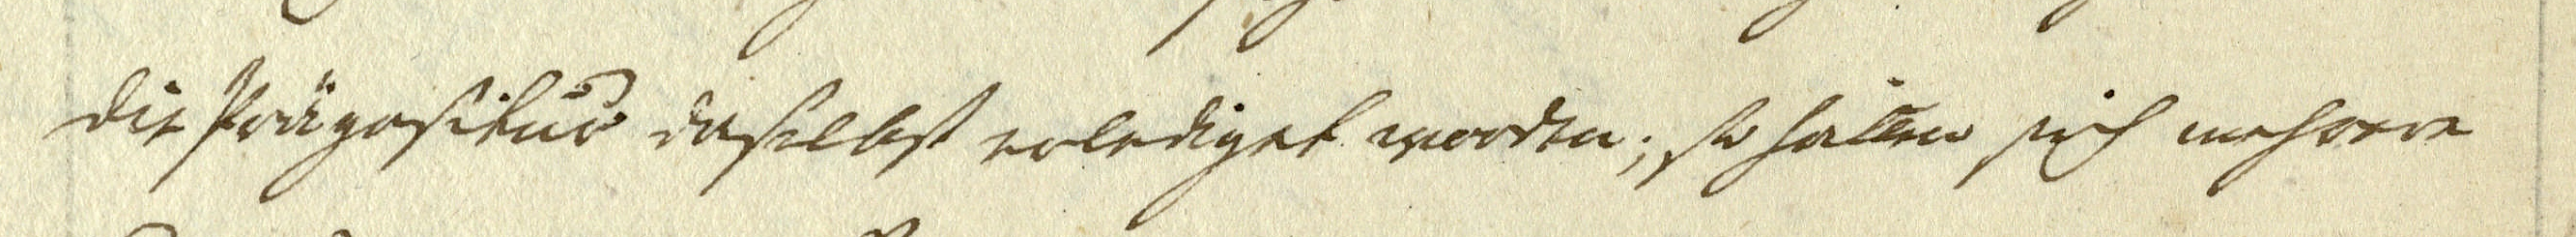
die Präpositur daselbst erlediget worden, so hätten sich mehrere
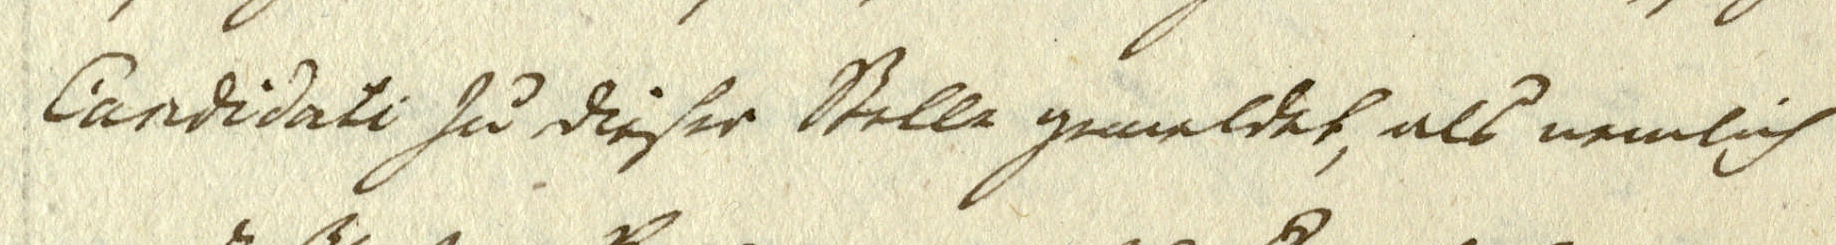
Candidati zu dieser Stelle gemeldet, als nemlich
